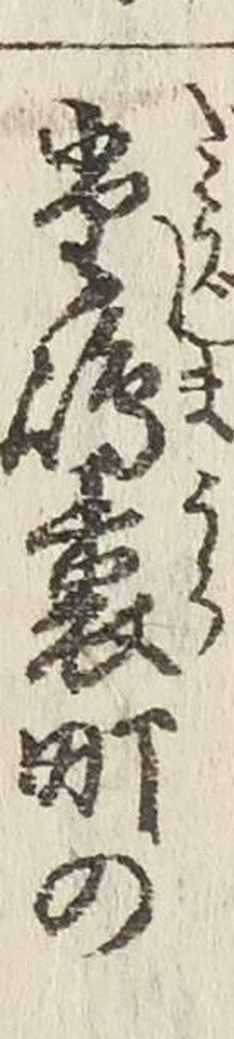堂嶋裏町の
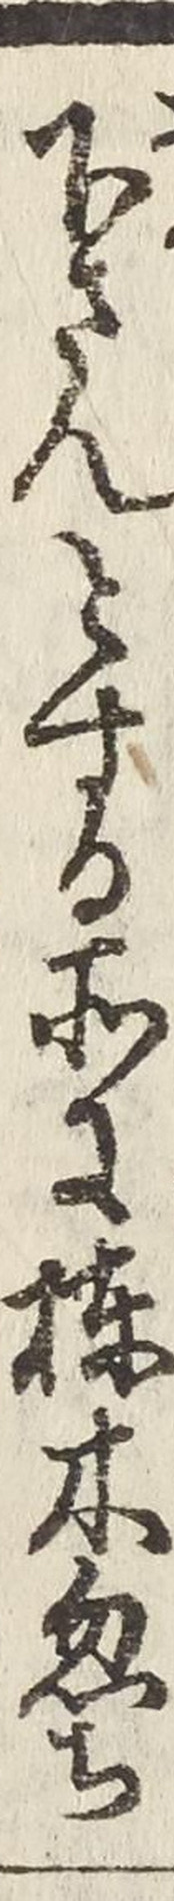下さんとする所に棟木忽ち
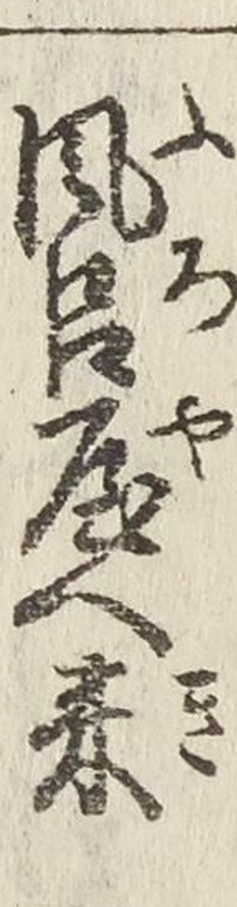風呂屋へ来
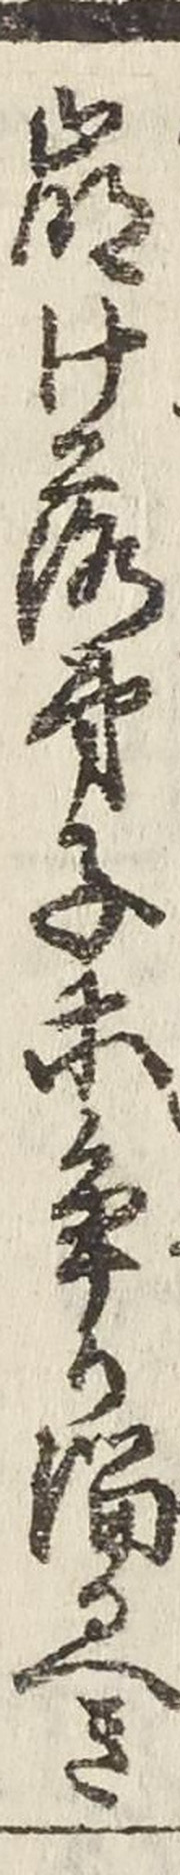崩け落弟子等争か溜るへき
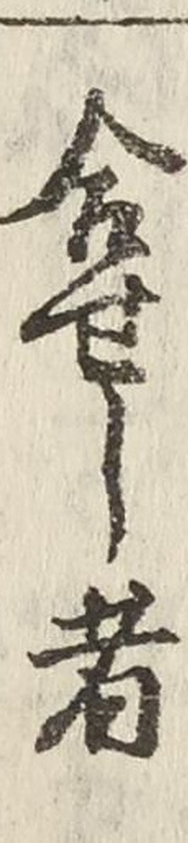合せし者
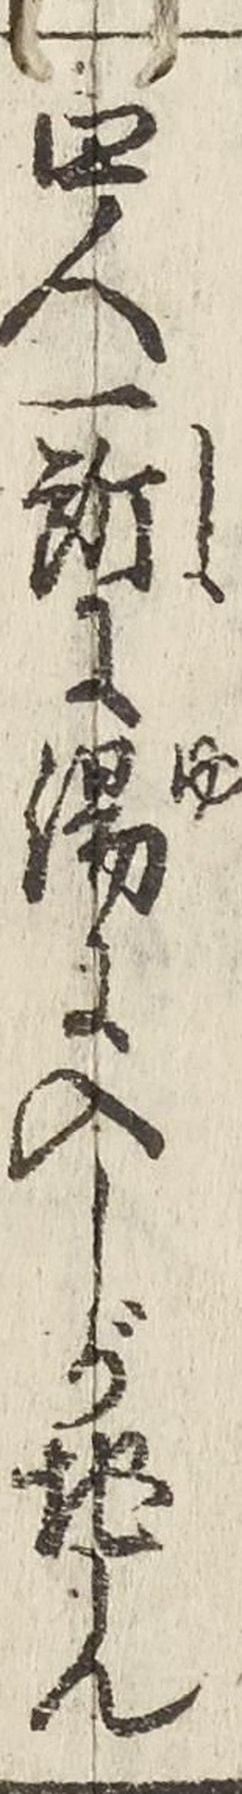四人一所に湯に入しが地しん
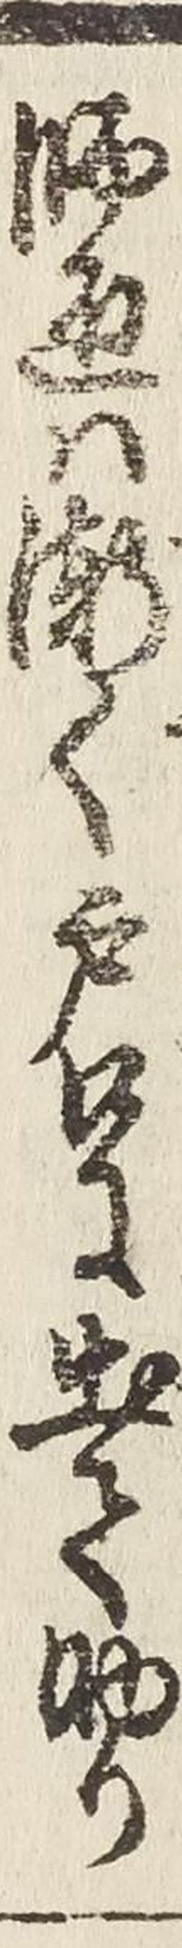師匠は漸く戸口に出て助り
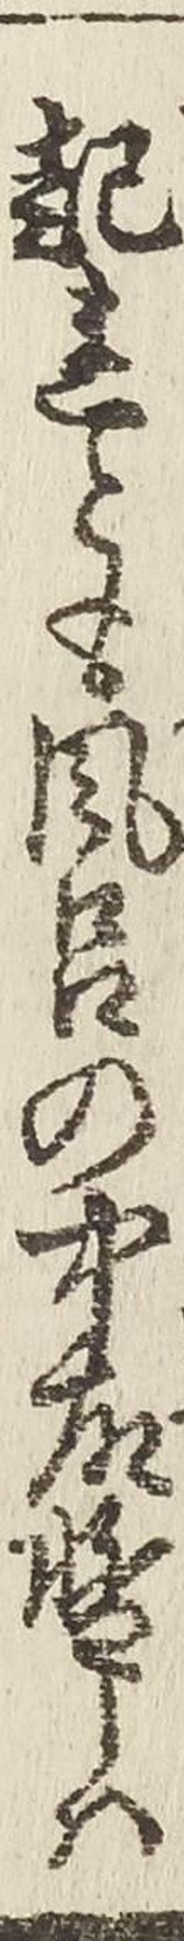起れとも風呂の中故暫しは
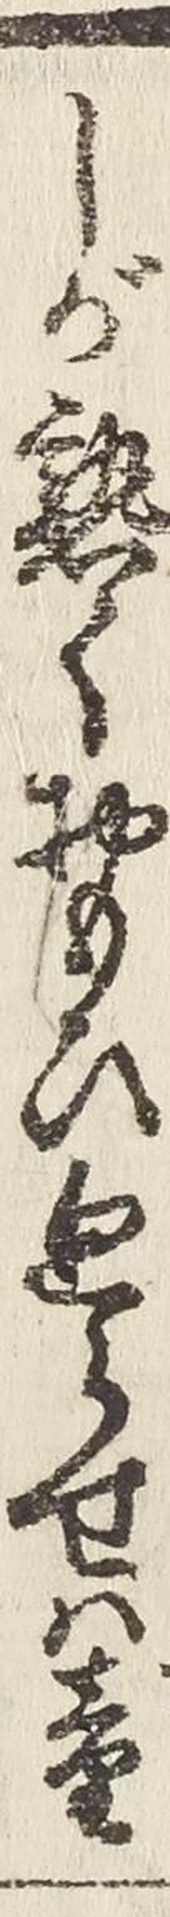しが熟くおもひ廻らせは童
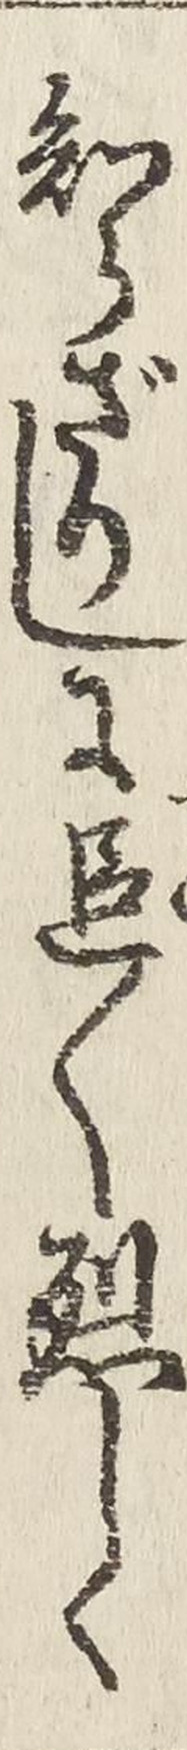知らざりしに追〳〵烈しく
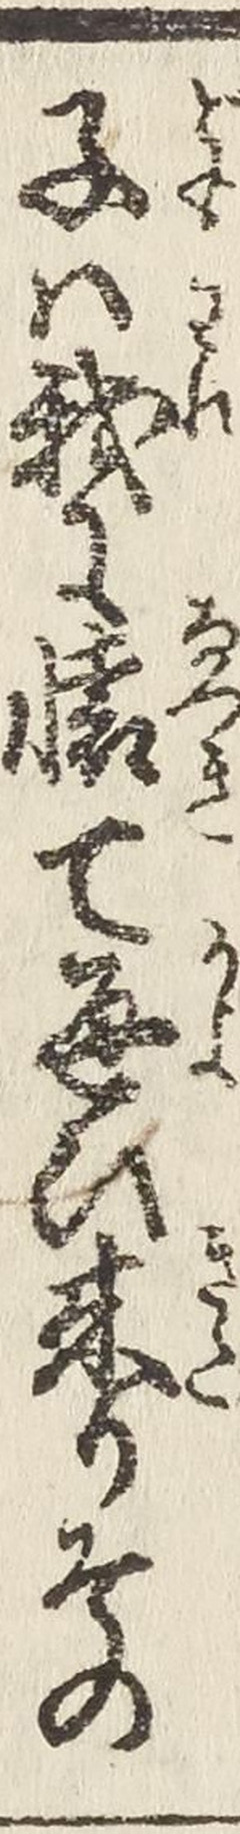子は我に懐て通ひ来りその
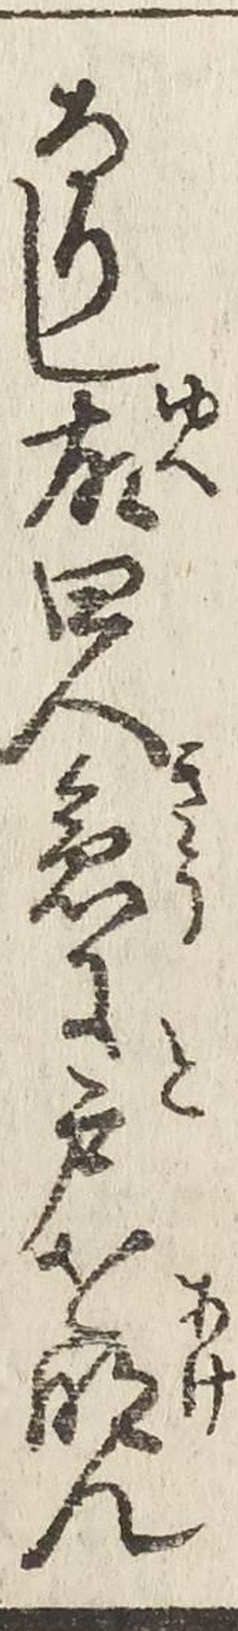なりし故四人急に戸を明ん
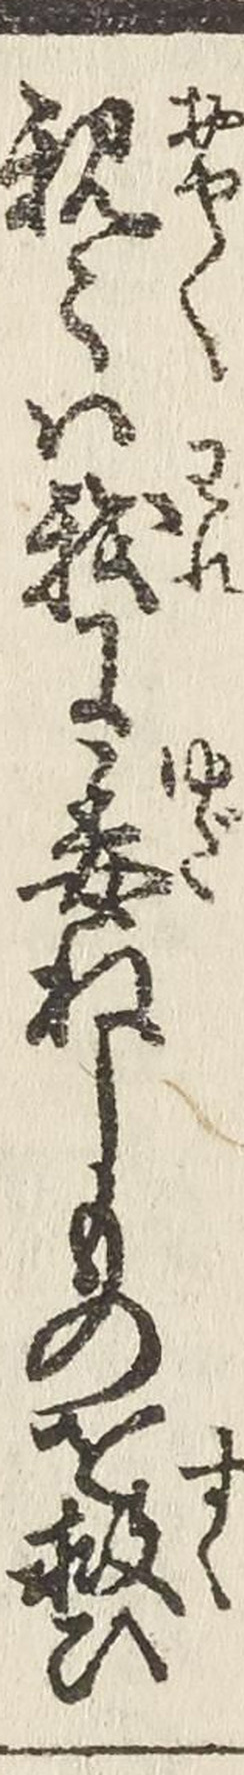親々は我に委ねしものを救ひ
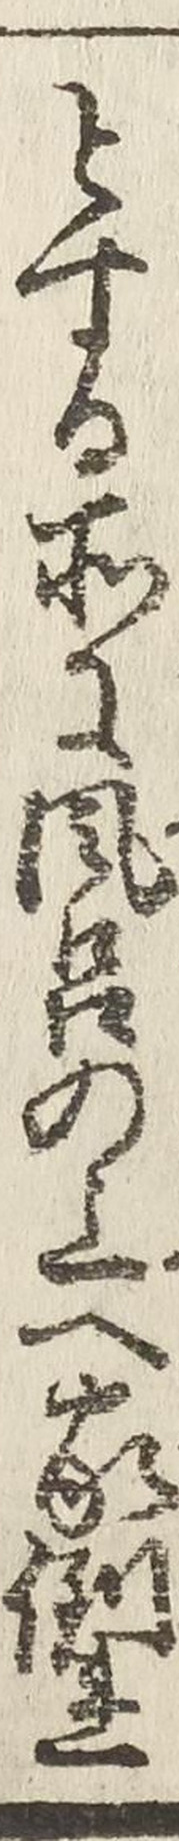とする所に風呂の上へ家倒れ
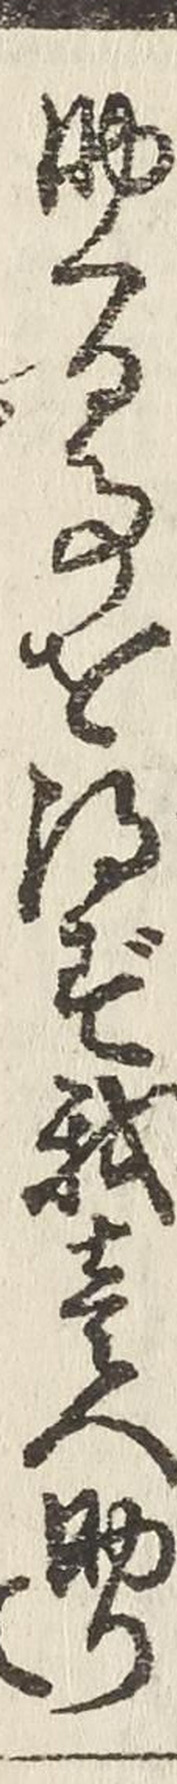助くる事を得ず我壱人助りて
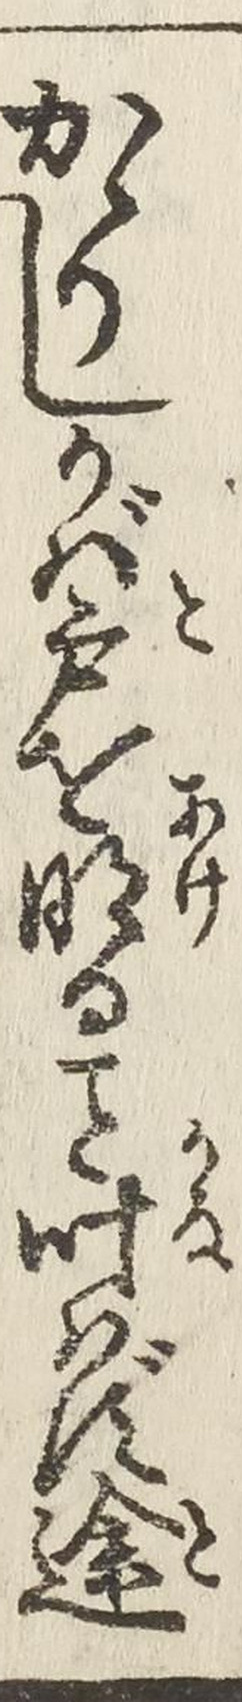かゝりしかば戸を明るを叶はず途
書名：大地震大（津浪）末代噺（の）種　三編全
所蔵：東京大学地震研究所図書室 Earthquake Research Institute Library, The University of Tokyo, JAPAN
